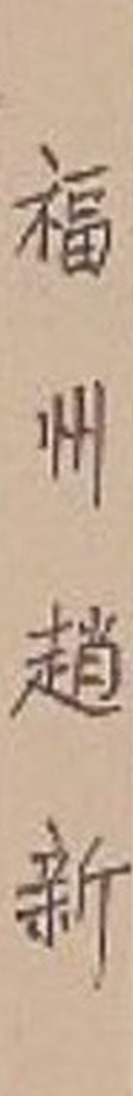福州趙新
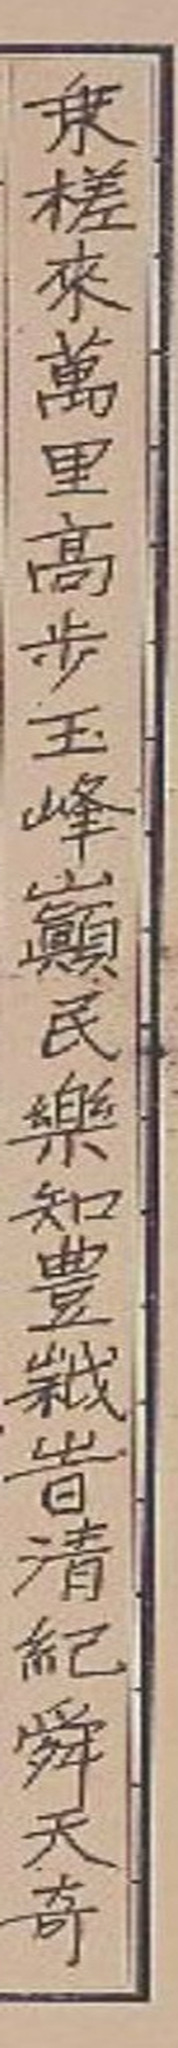乗槎来万里高歩玉峰巓民楽和豊歳時清紀舜天奇
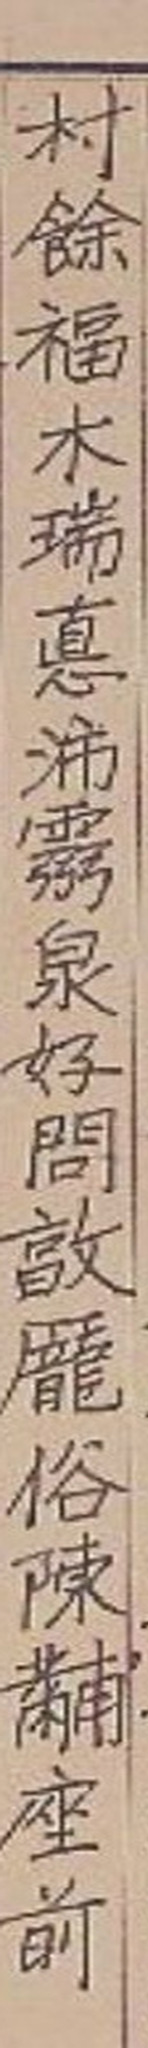村余福木瑞悳沛霛泉好問敦龐俗陳黼座前
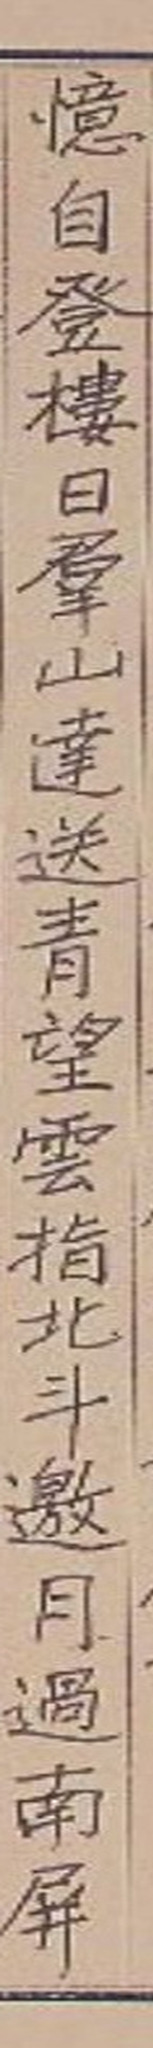憶自登楼日群山達送青望雲指北斗邀月過南屏
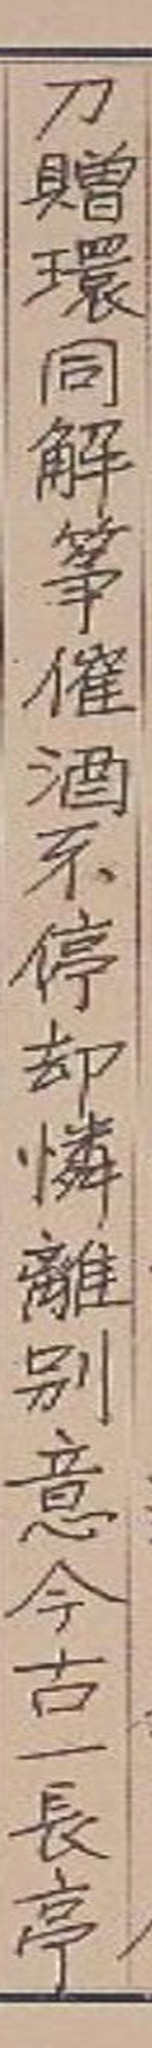刀贈環同解筝催酒未停却憐離別意今古一長亭
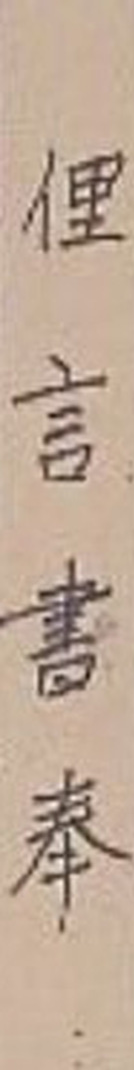俚言書奉
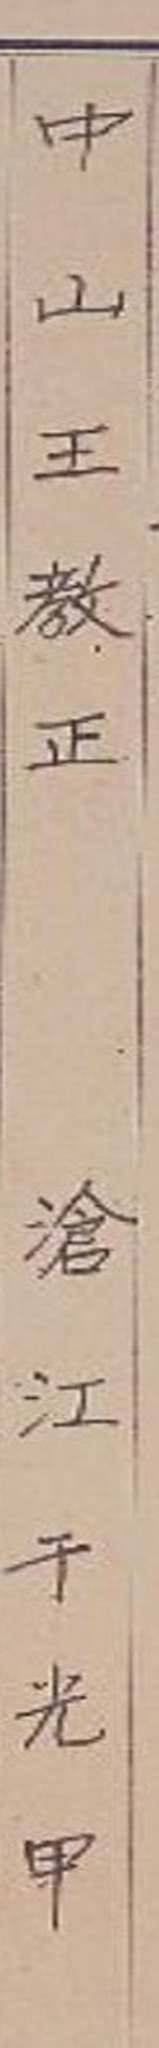中山王教正滄江干光甲
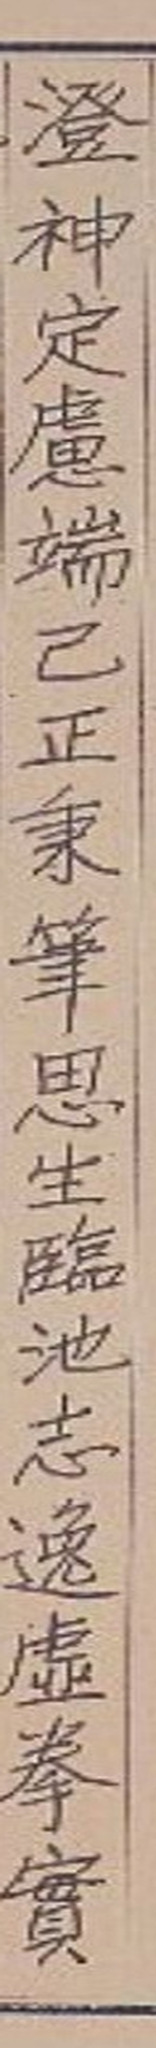澄神定慮端己正秉筆思生臨池志逸虚挙実
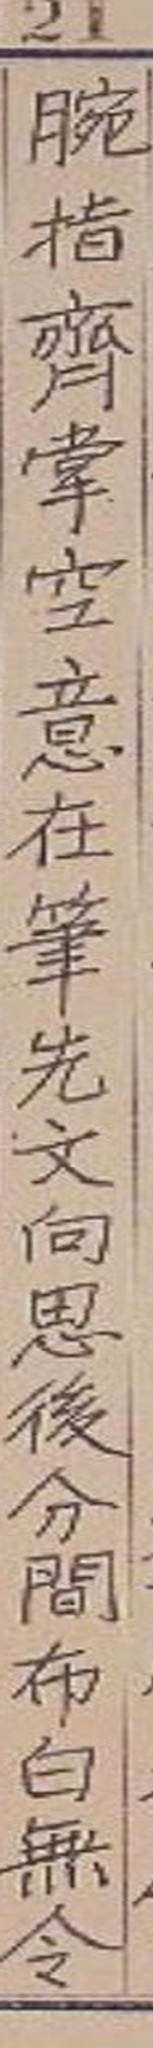腕指斉掌空意在筆先文向思後分間布白無令
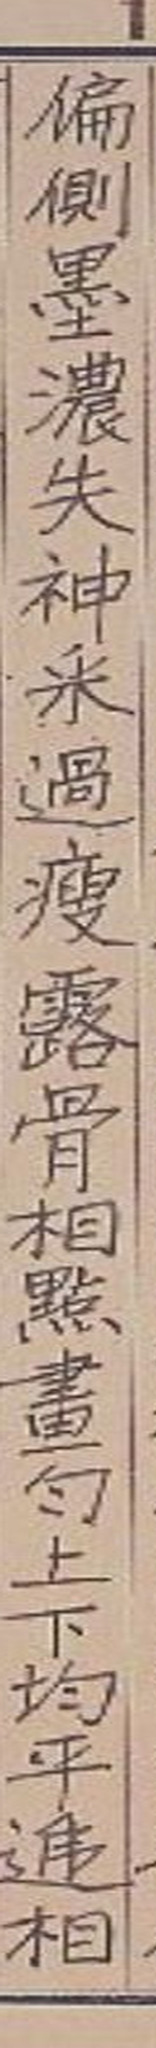偏側墨濃失神采過痩露骨相点画匀上下均平逓相
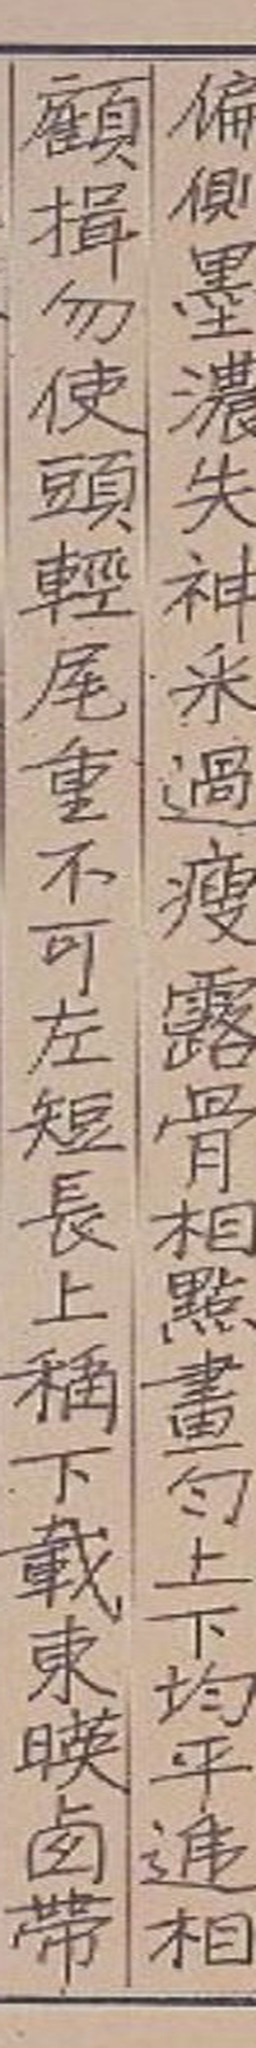顧揖勿使頭軽尾重不可左短長上称下載東映卥帯
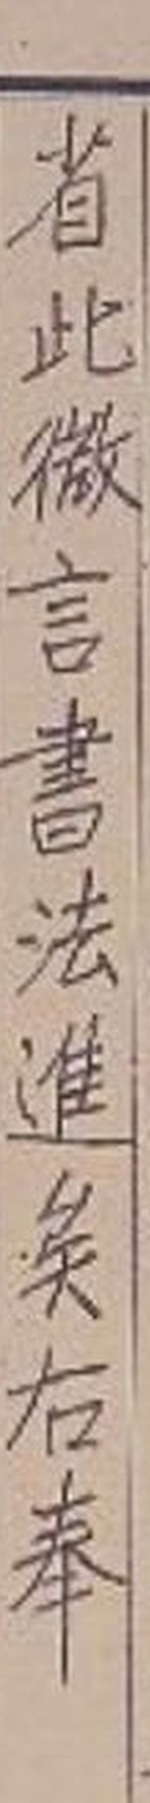省此微言書法進矣右奉
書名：支那冊封使来琉諸記 下巻
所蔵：University of the Ryukyus Library
